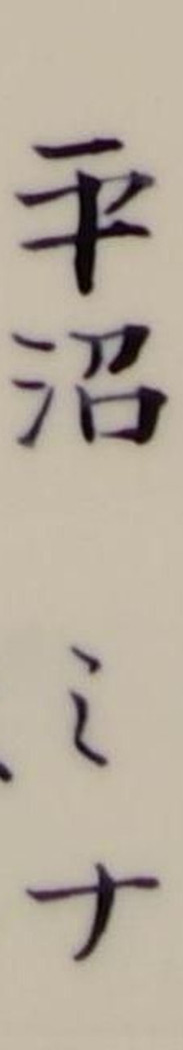平沼ミナ
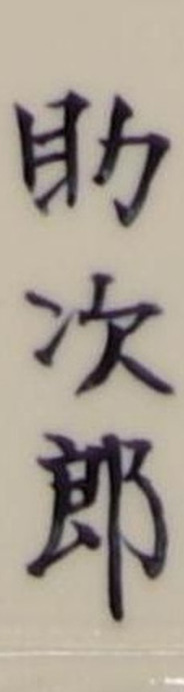助次郎
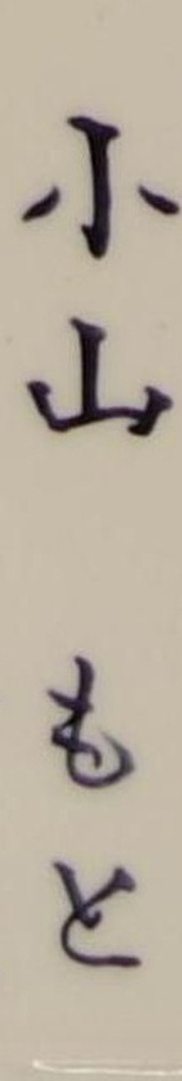小山もと
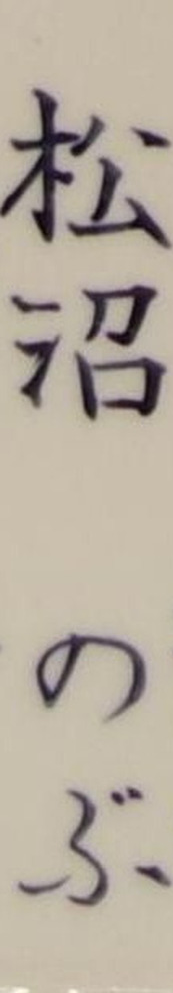松沼のぶ
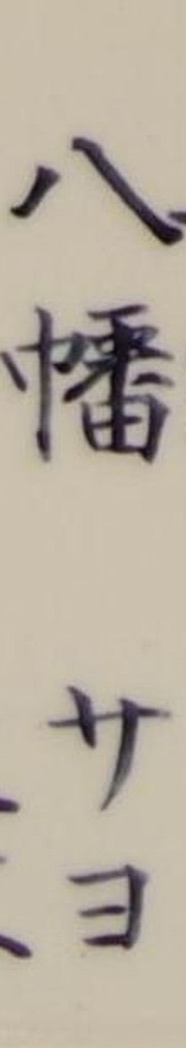八幡サヨ
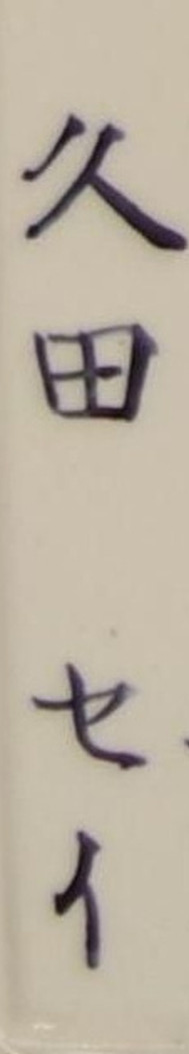久田セイ

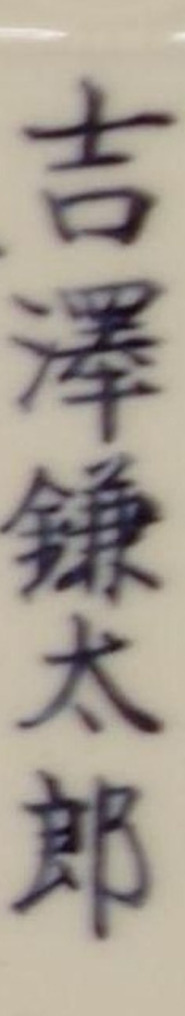吉澤鎌太郎
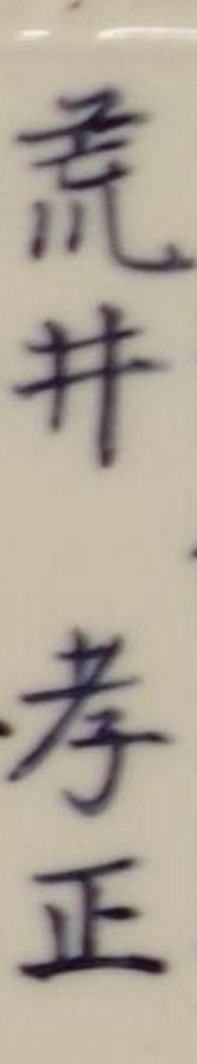荒井孝正
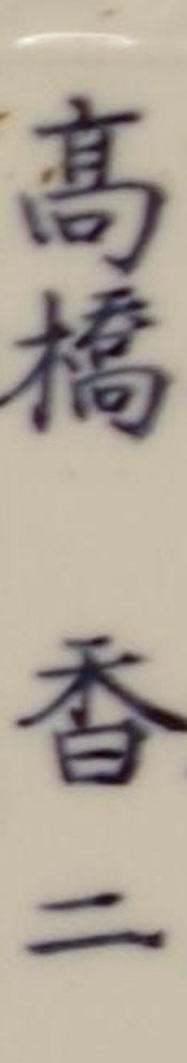高橋香二
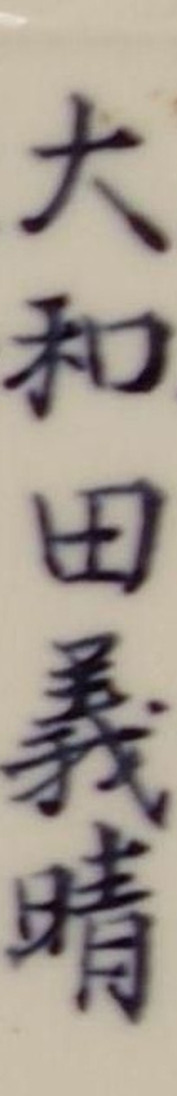大和田義晴
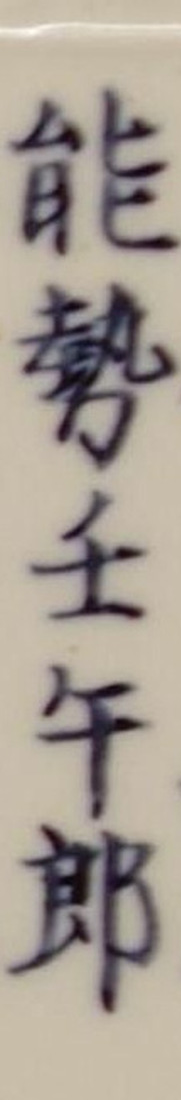能勢壬午郎
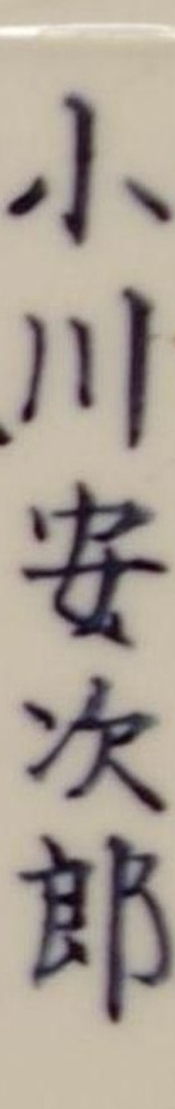小川安次郎
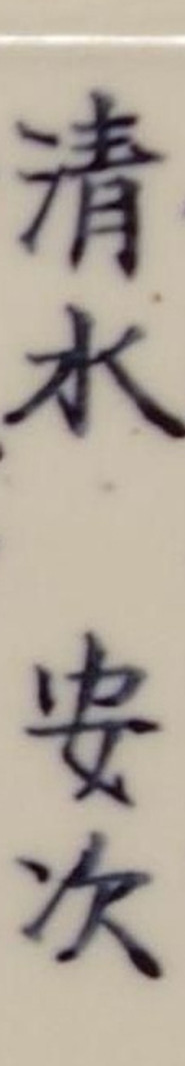清水安次
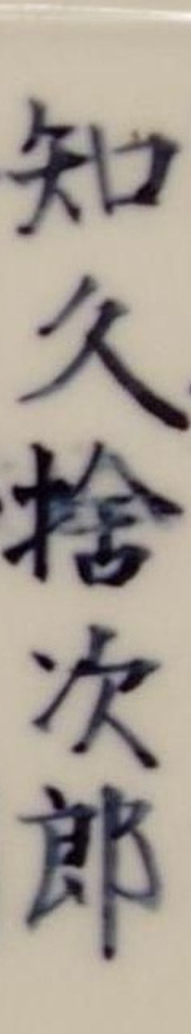知久捨次郎
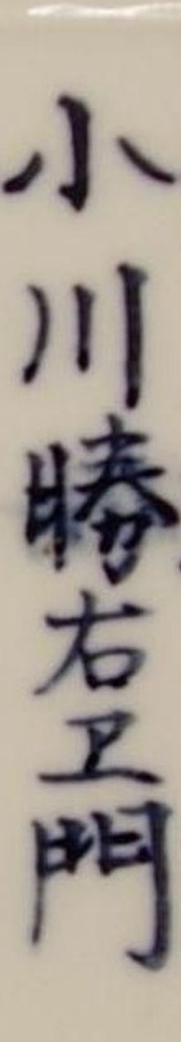小川勝右ヱ門
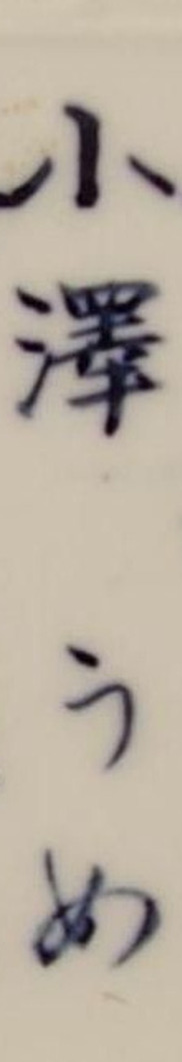小澤うめ
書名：E~L
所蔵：高野山金剛峯寺
